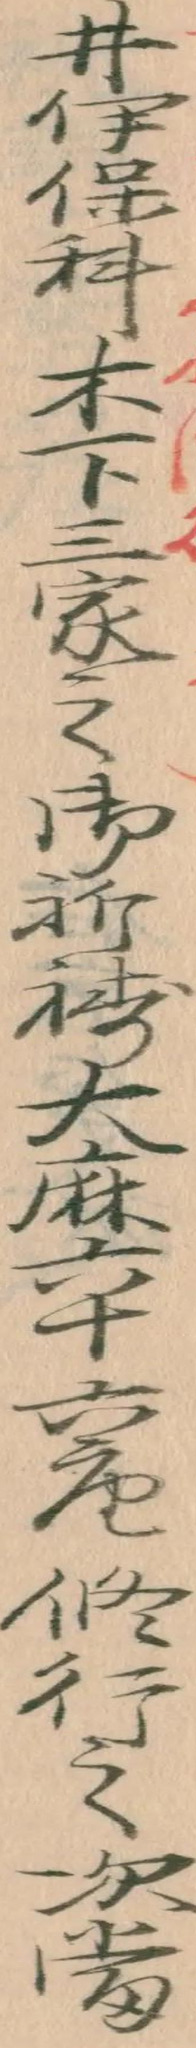井伊保科木下三家之御祈祷大麻六十六座修行之次當
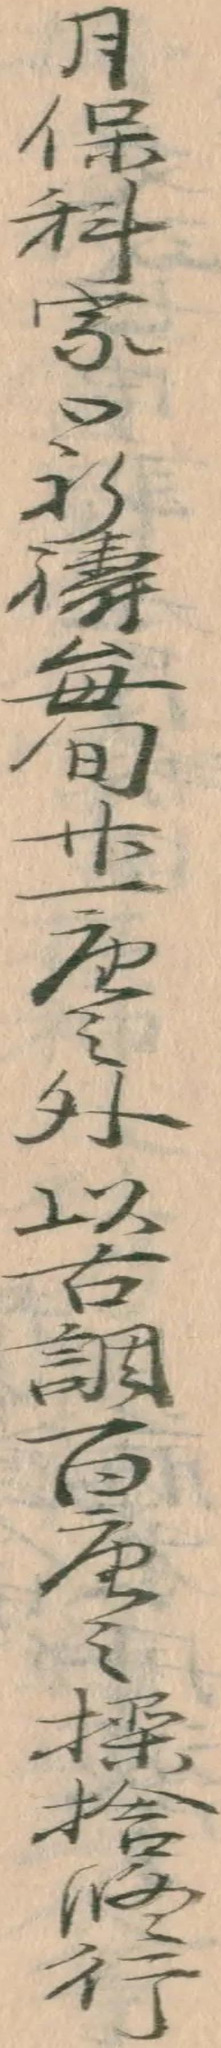月保科家御祈祷毎旬廿一座之外以古調百座之操捨修行
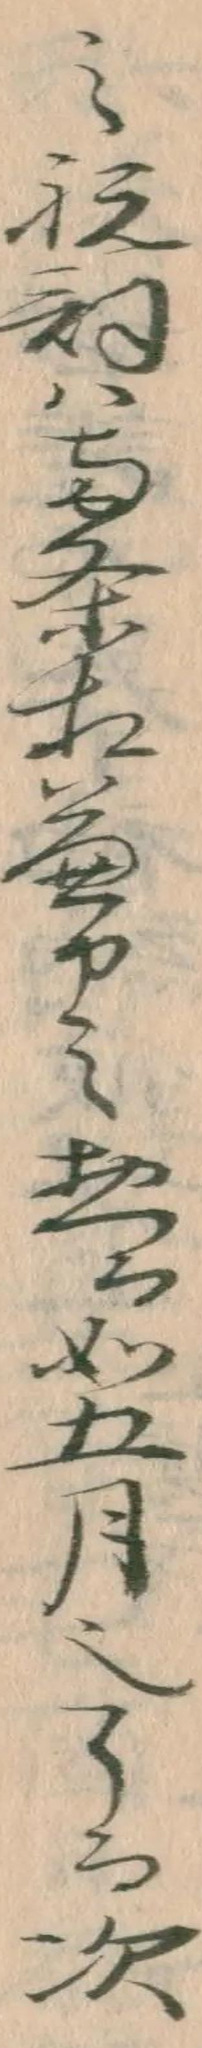之祝詞ハ両条相兼申候惣而如五月也了而次
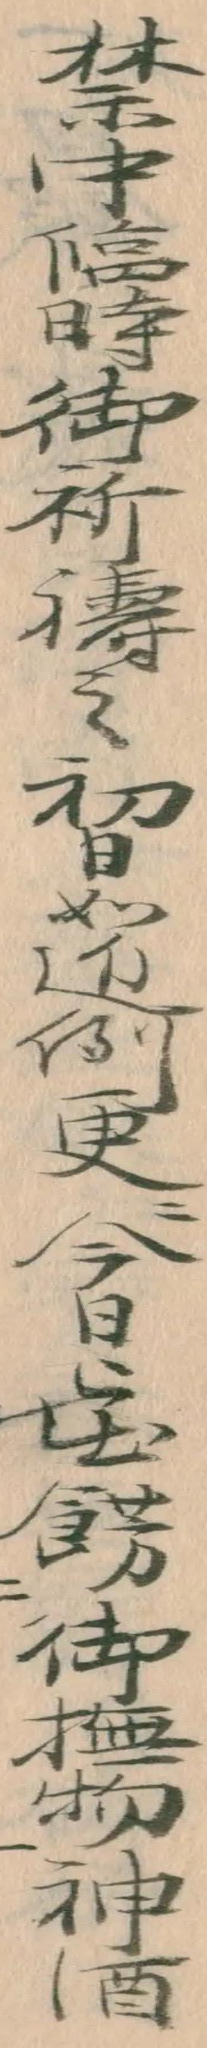禁中臨時御祈祷之初日如近例更ニ今日被出餝御撫物神酒
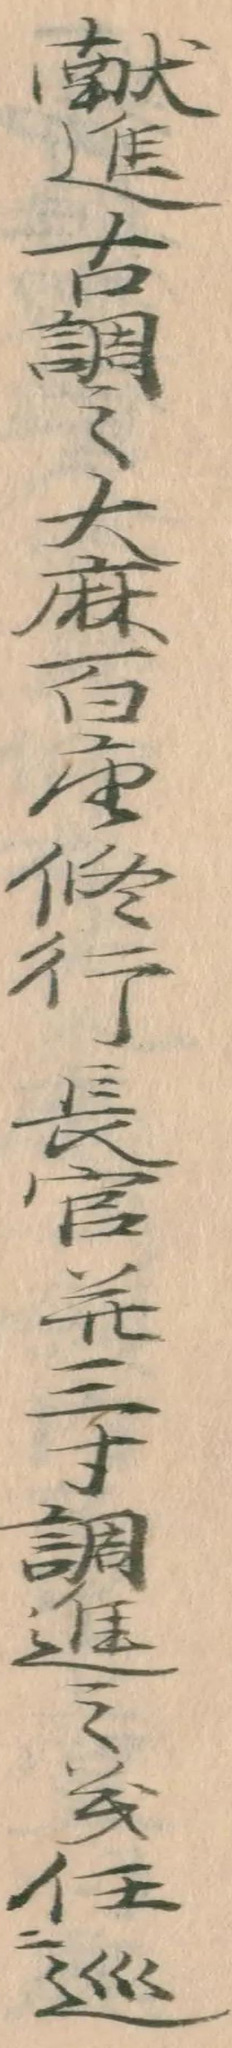献進古調之大麻百座修行長官并三寸調進之義任巡
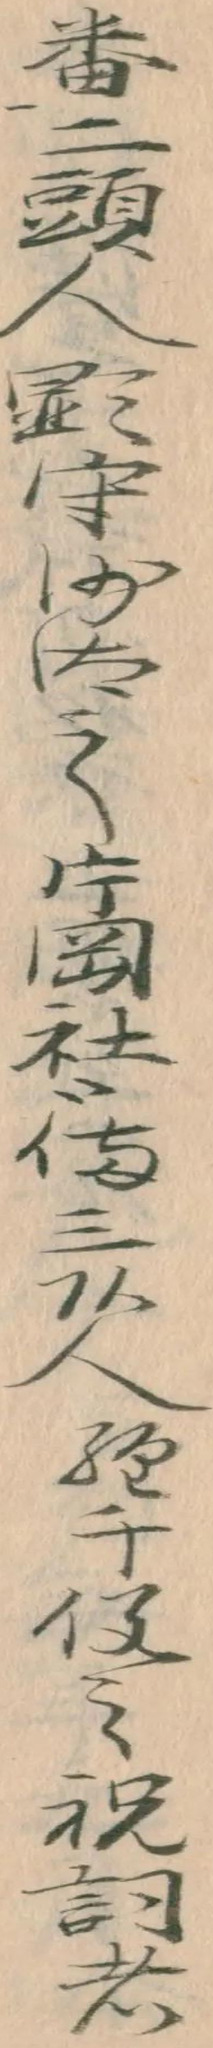番二頭人顕守沙汰也片岡社御備三頭人経千役之祝詞者
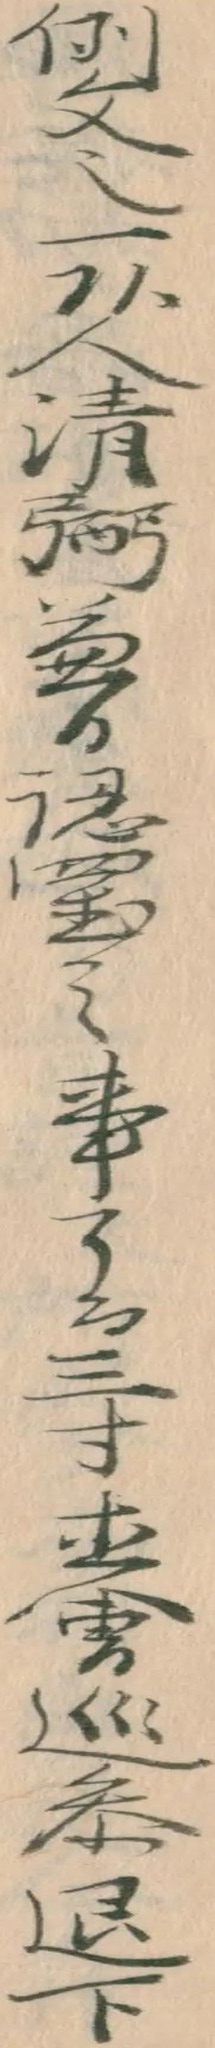例文也一頭人清弼兼日認置之事了而三寸直會巡参退下
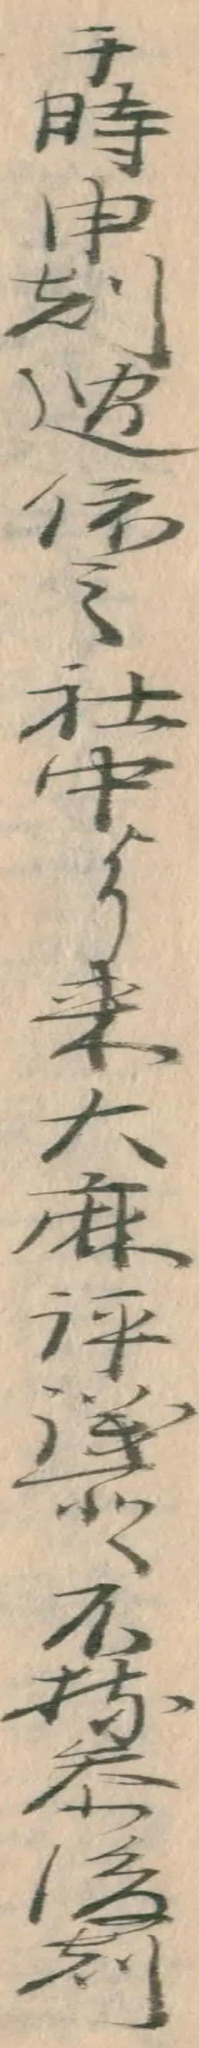于時申刻過依之社中より来大麻評議所へ不持参後刻
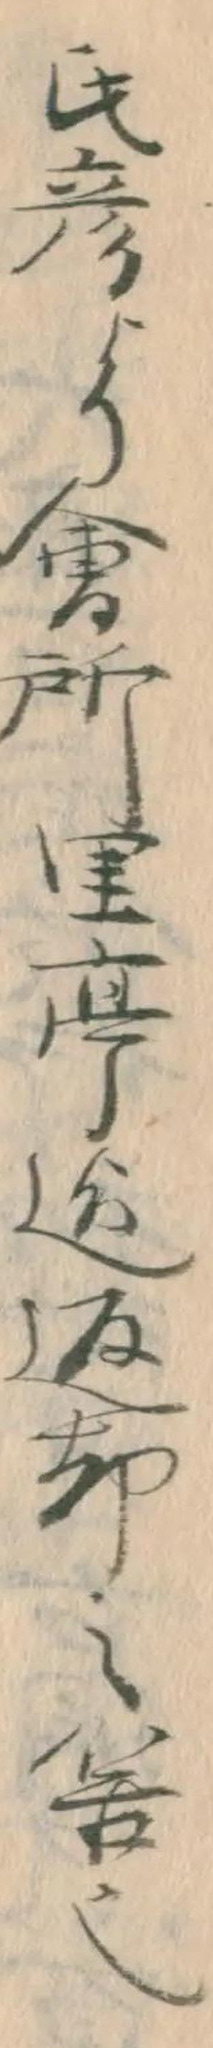氏彦より會所里亭迄返却之筈也
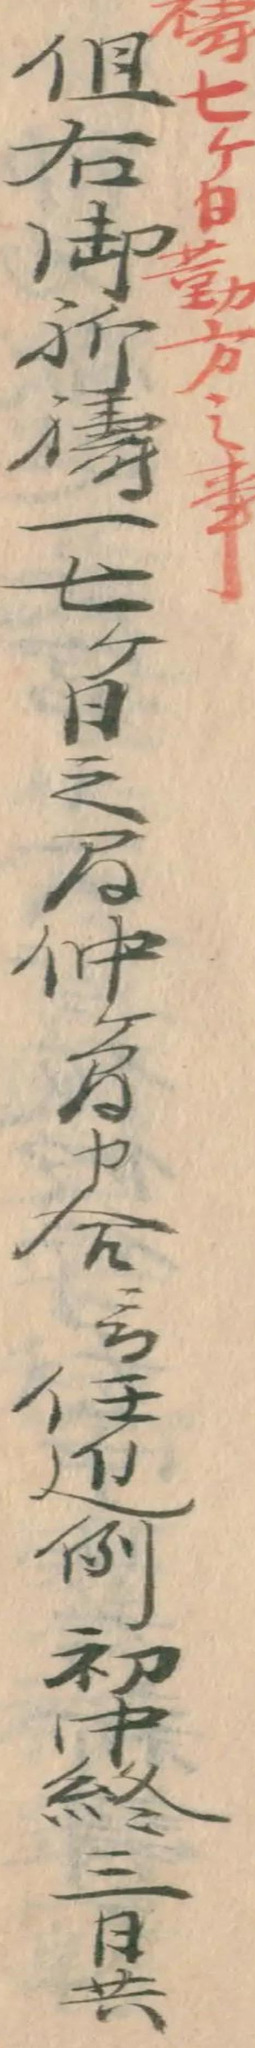但右御祈祷一七ヶ日之間仲ヶ間申合ニ而任近例初中終三日共

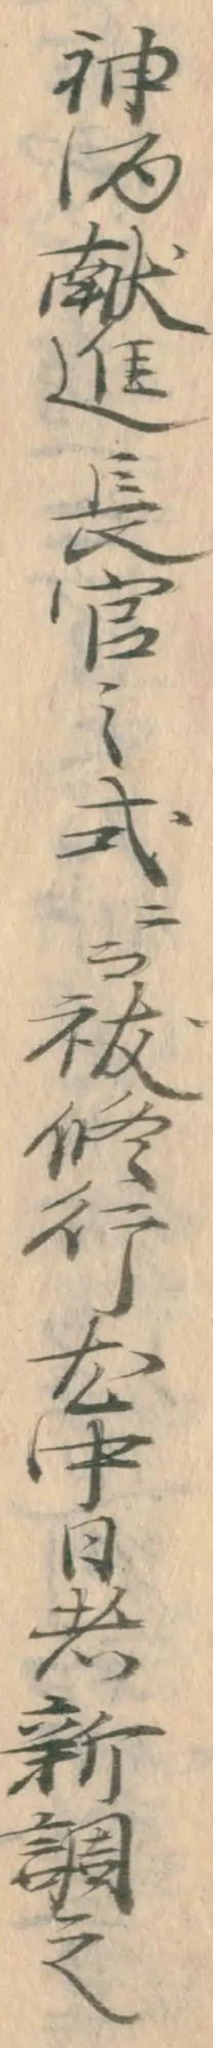神酒献進長官之式ニ而祓修行尤中日者新調之
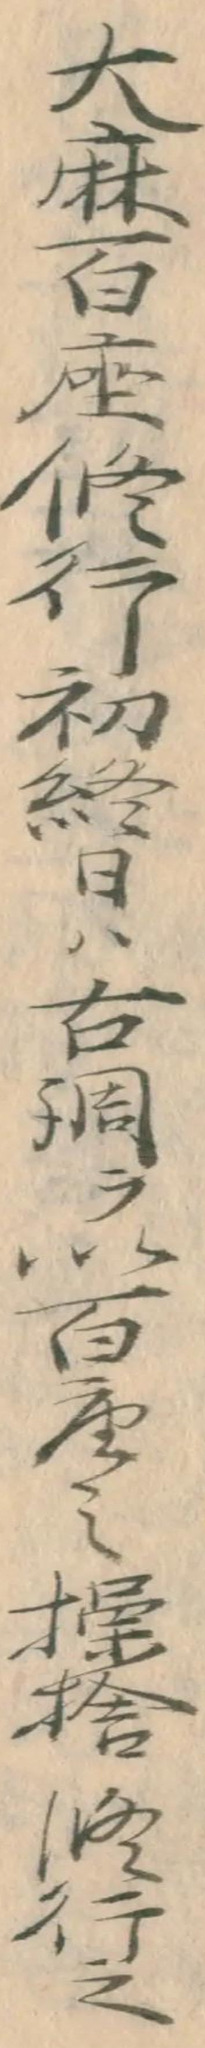大麻百座修行初終日ハ古調ヲ以百座之操捨修行之
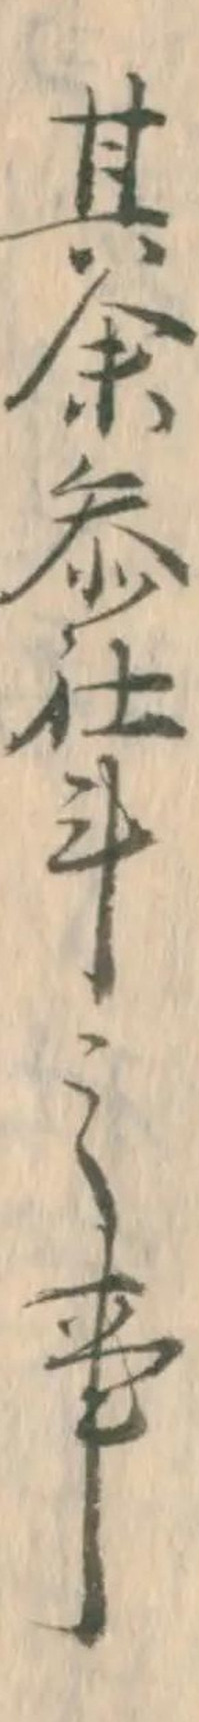其余参社斗之事
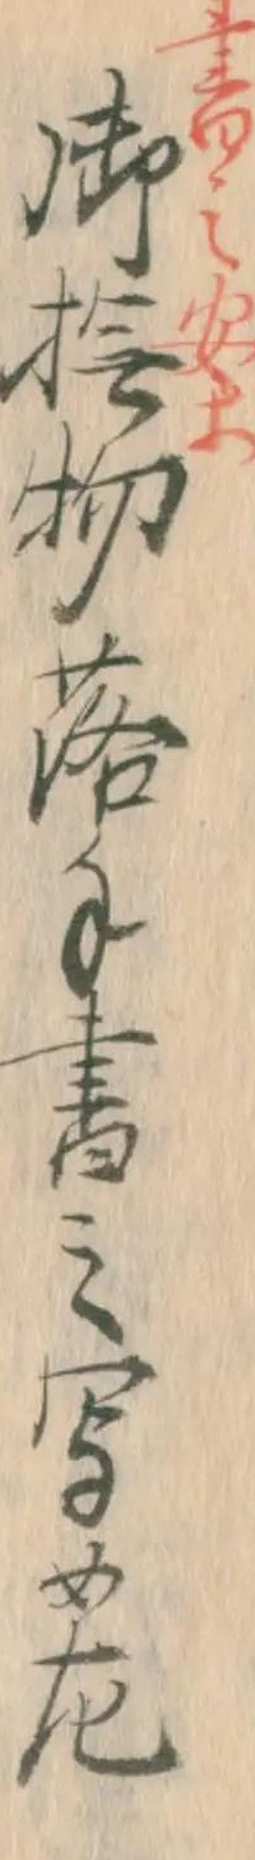御捻物落手書之写左
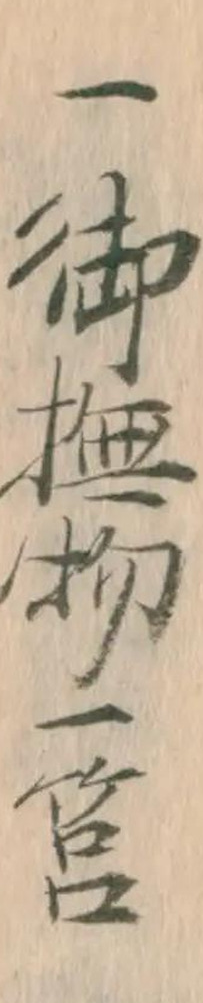一御撫物一筥
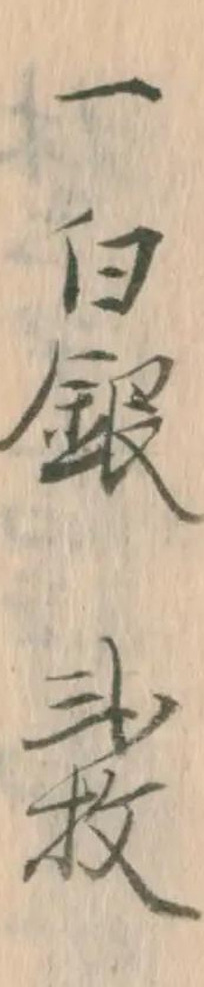一白銀弐枚
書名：賀茂社記録. 第74冊
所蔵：国立国会図書館 National Diet Library, JAPAN
